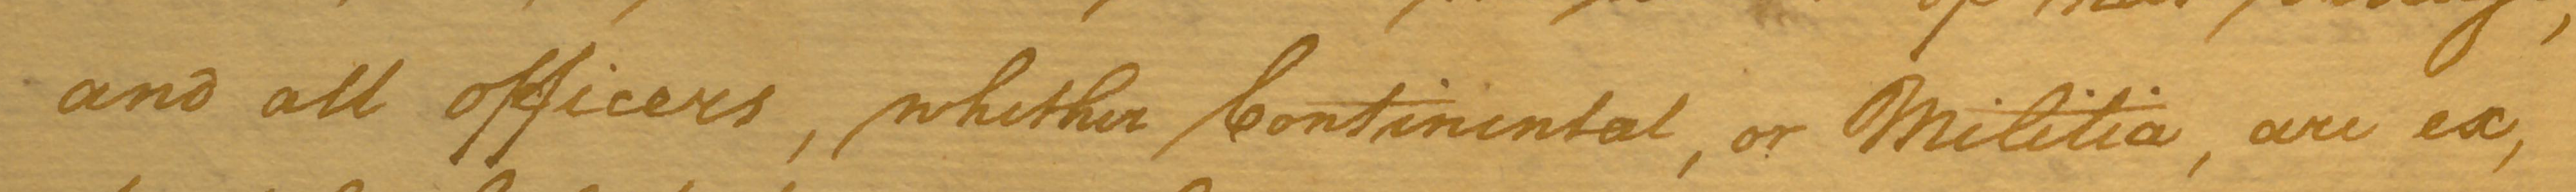and all officers, whether Continental, or Militia, are ex-
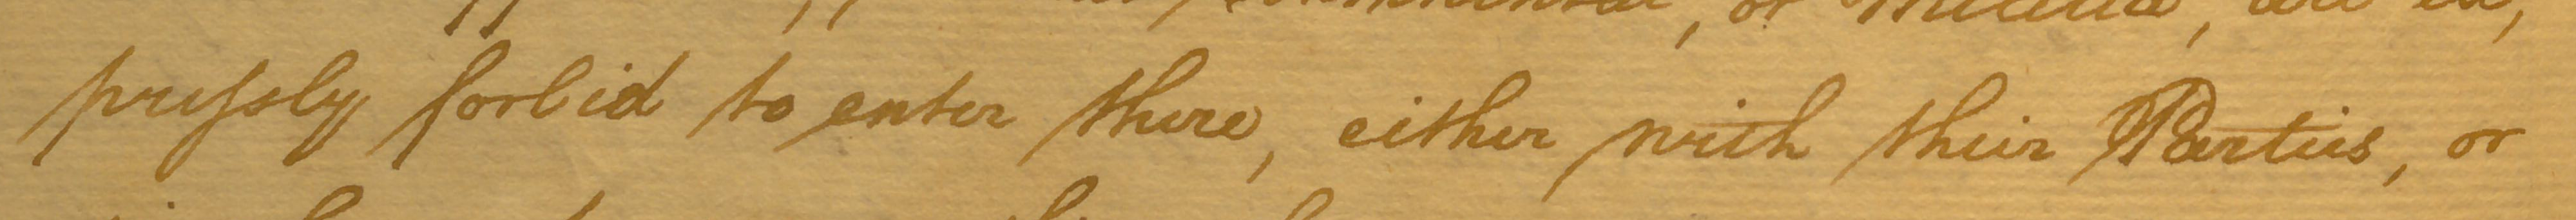pressly forbid to enter there, either with their Parties, or
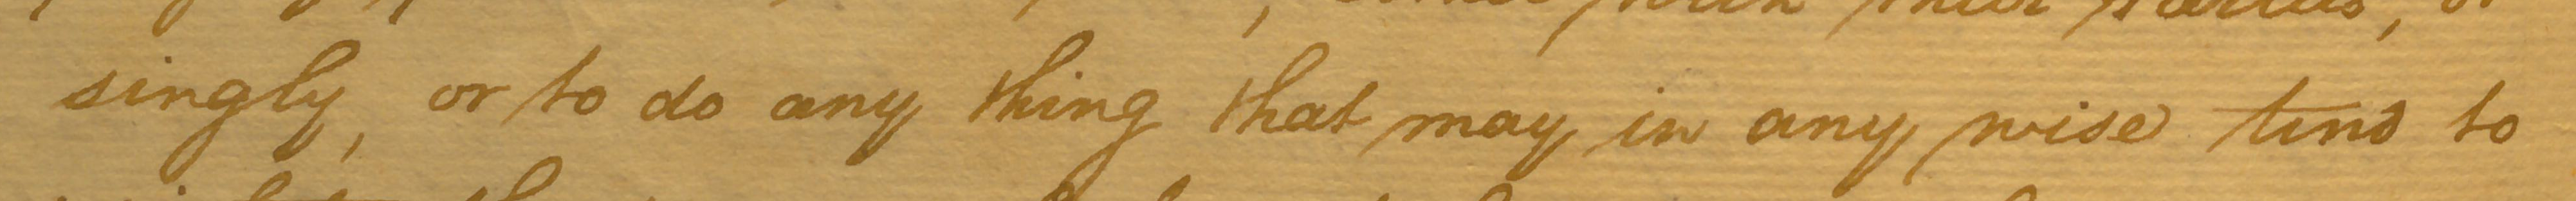singly or to do any thing that may in any wise tend to
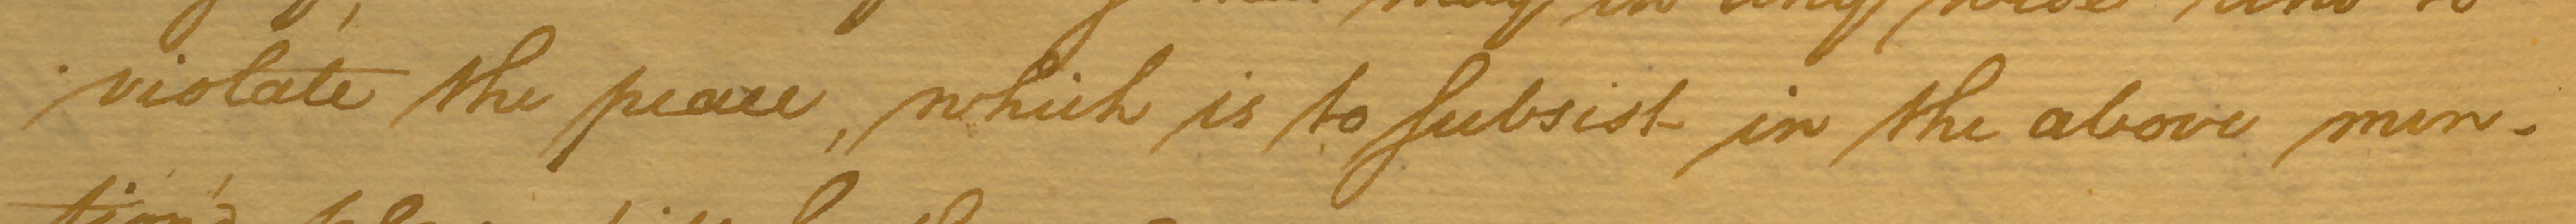violate the peace, which is to subsist in the above men-
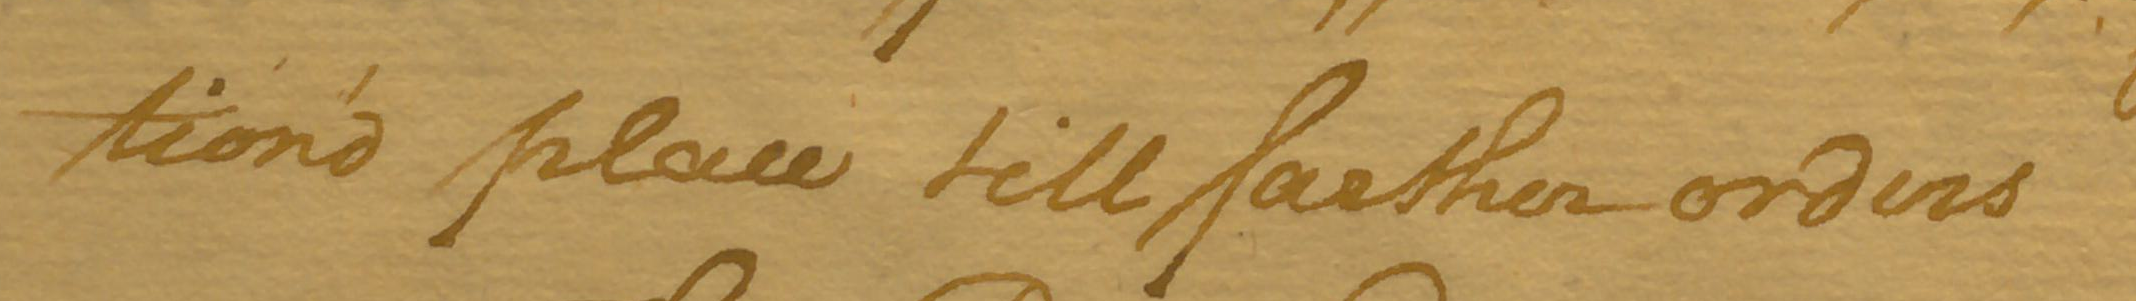tion'd place till farther orders
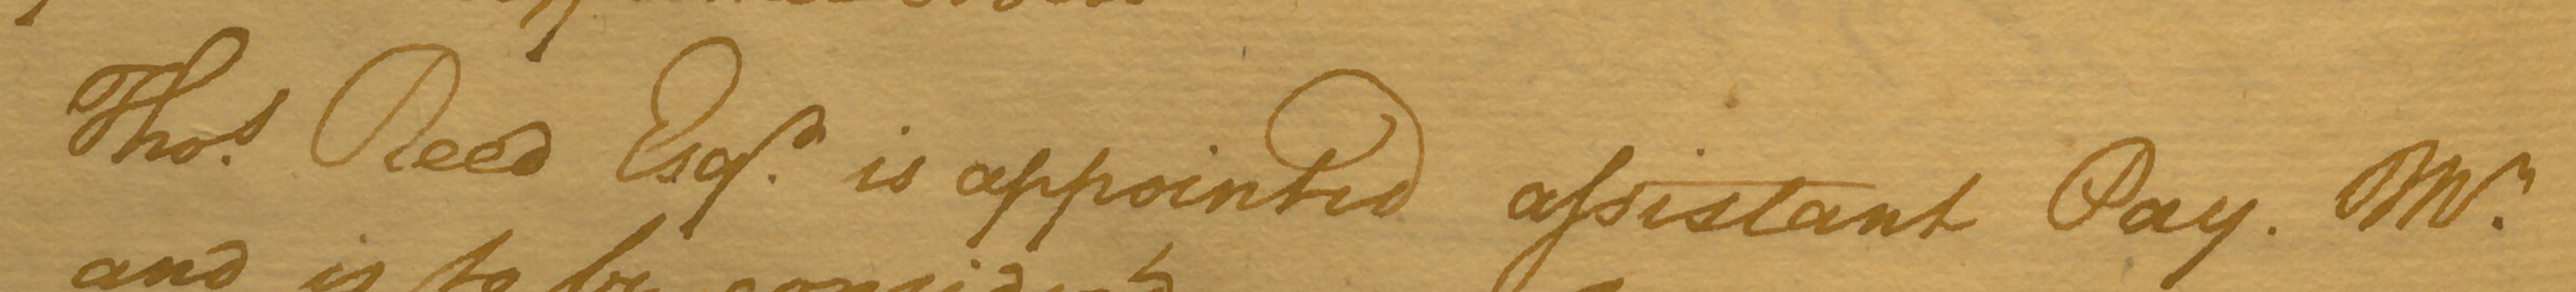Tho^s. Reed Esq^r. is appointed assistant Pay M^r.
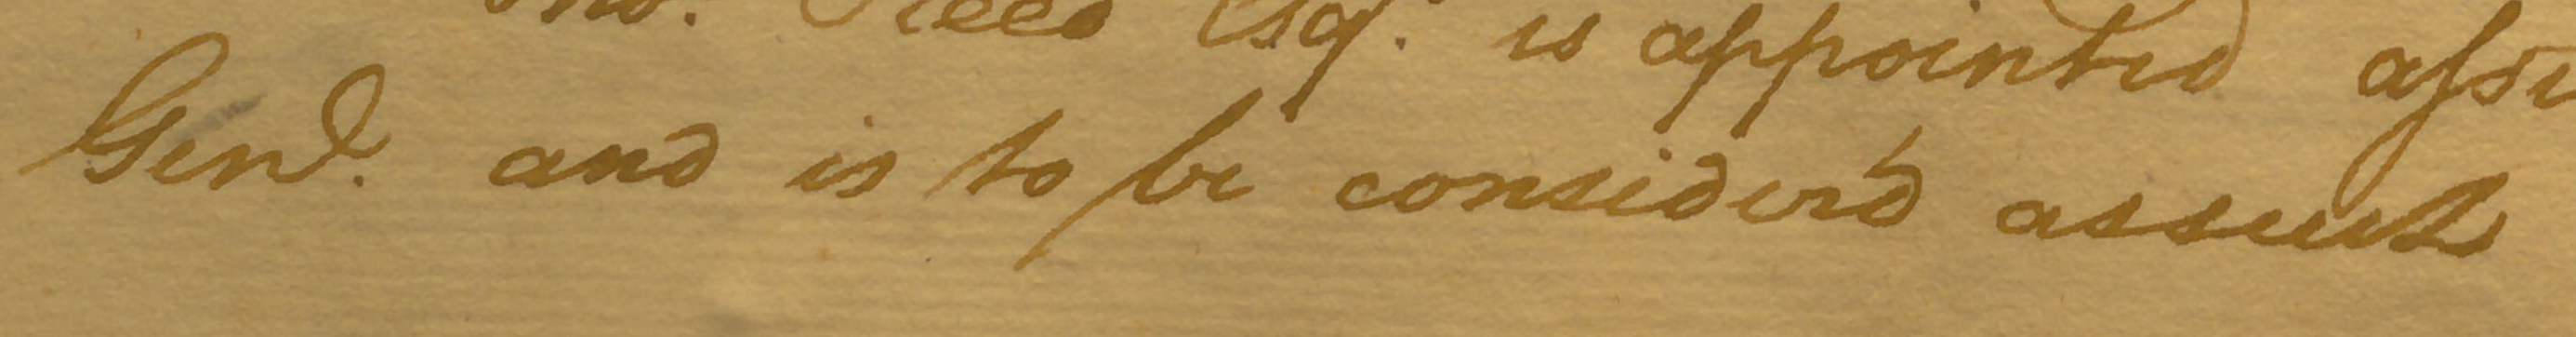Gen^l. and is to be consider'd as such
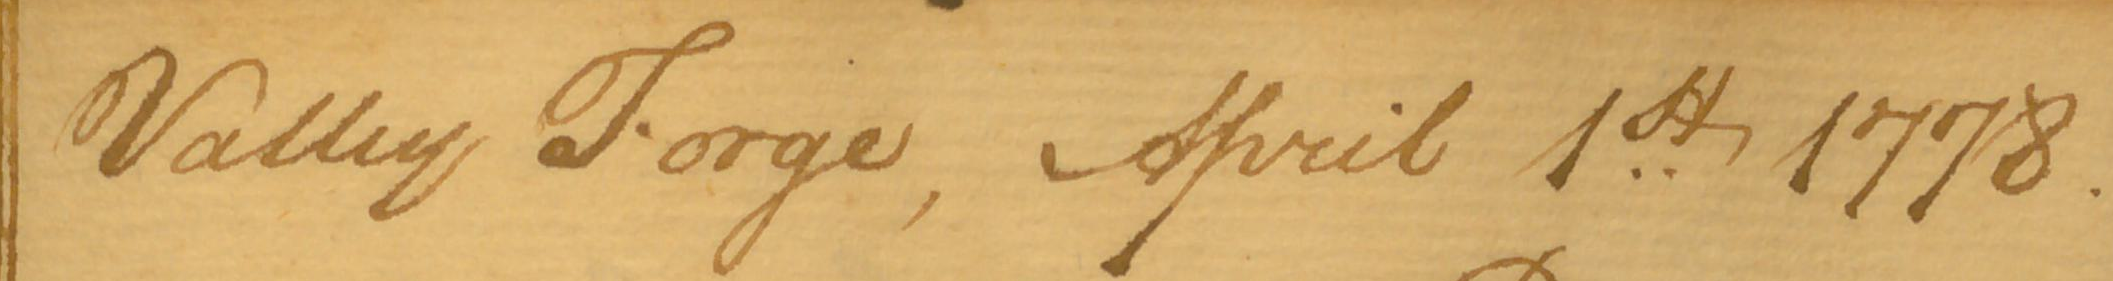Valley Forge, April 1^st. 1778.
